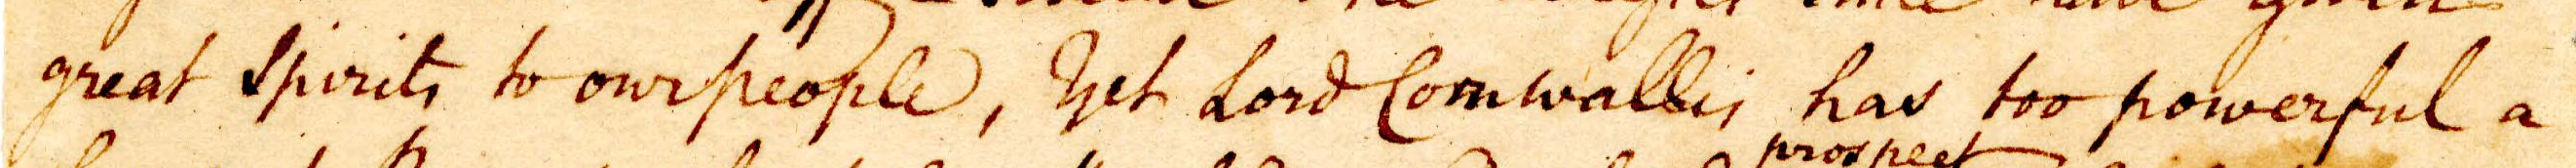great Spirits to our people, Yet Lord Cornwallis has too powerful a
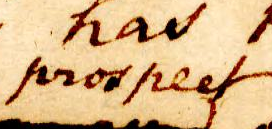prospect
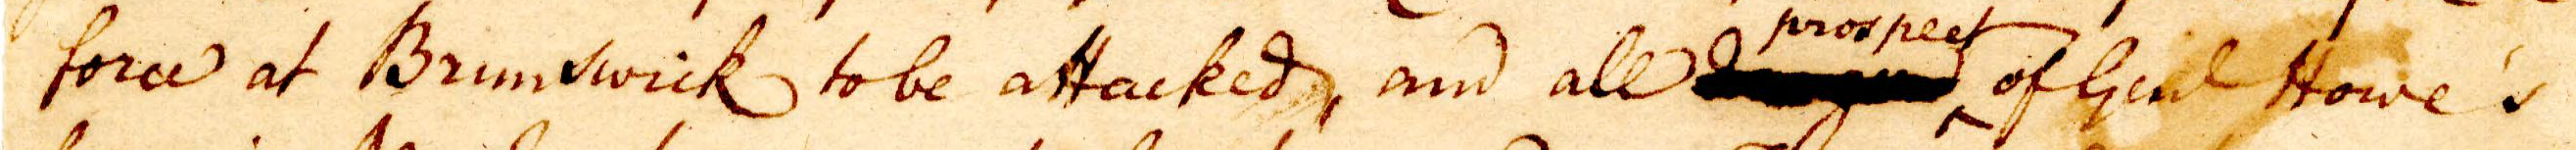force at Brunswick to be attacked, and all ^ of Gen^l Howe's
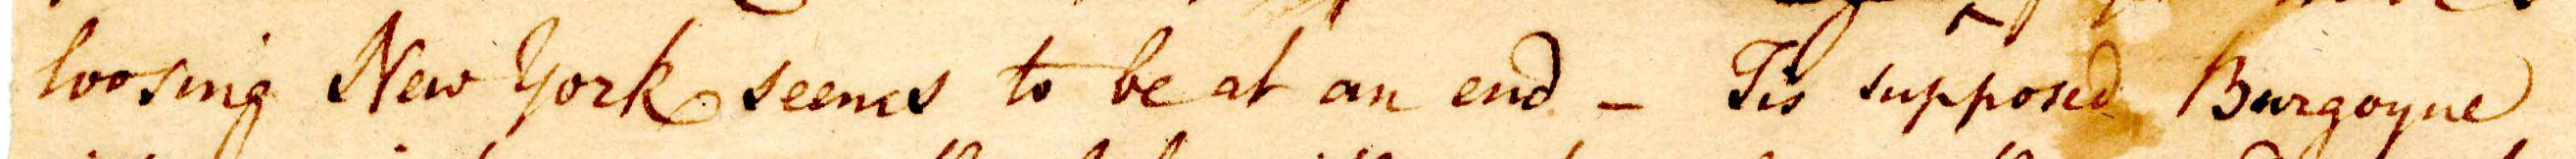loosing New York seems to be at an end- Tis supposed Burgoyne
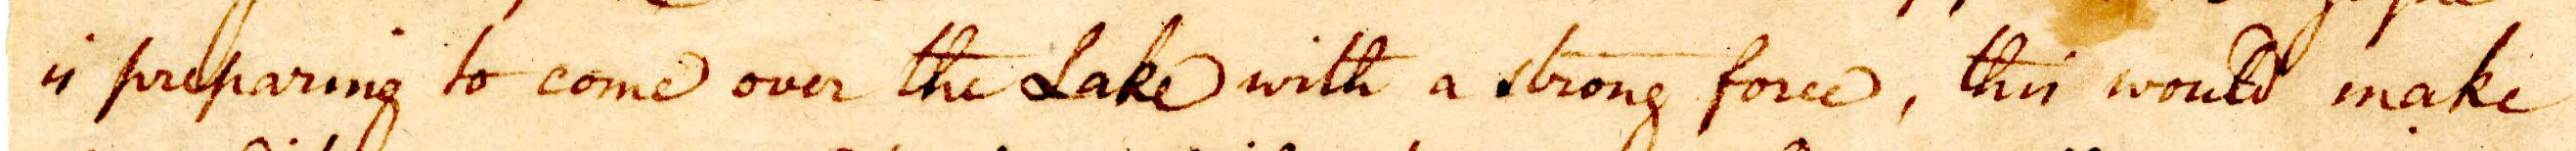is preparing to come over the Lake with a strong force, this would make
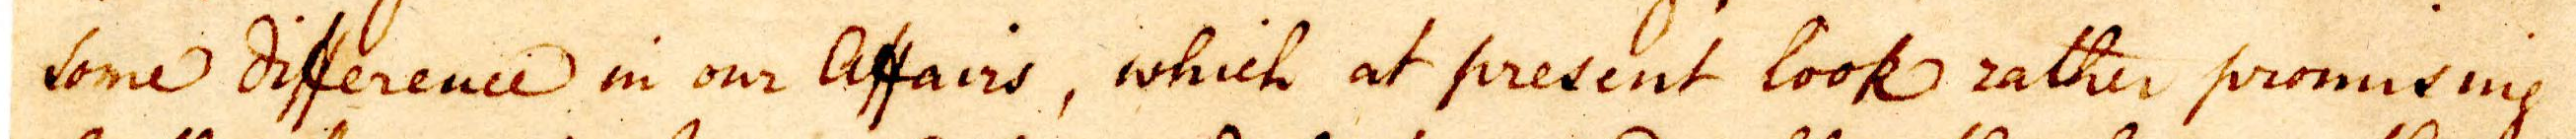some difference in our Affairs, which at present look rather promising
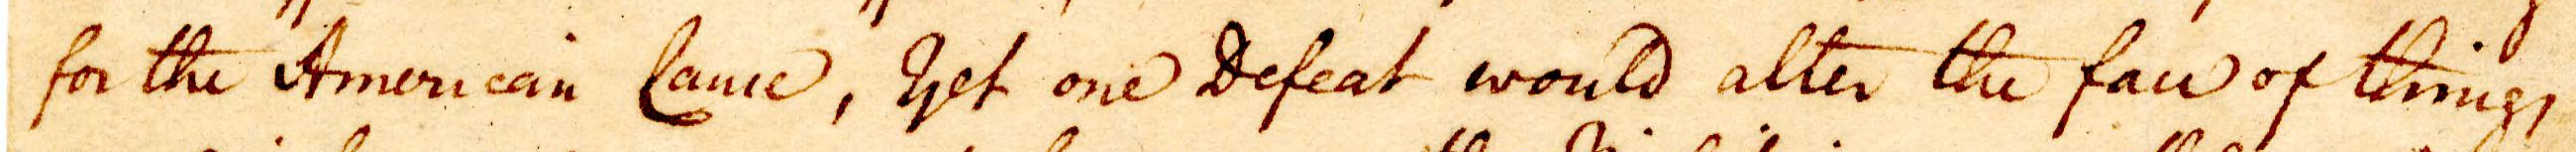for the American Cause, Yet one Defeat would alter the face of things
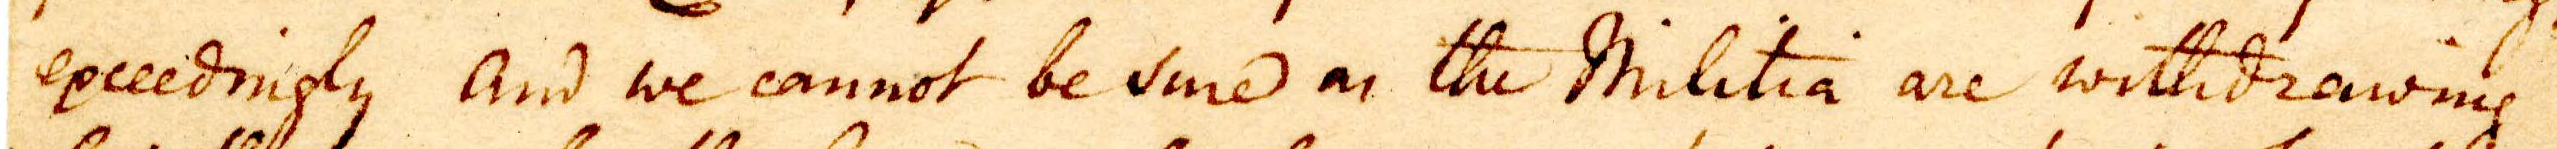exceedingly and we cannot be sure as the Militia are withdrawing
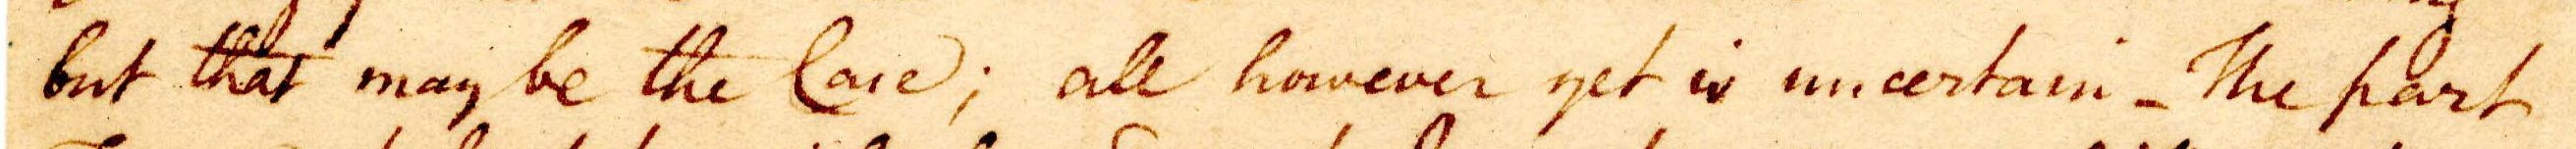but that may be the Case; all however yet is uncertain- The part
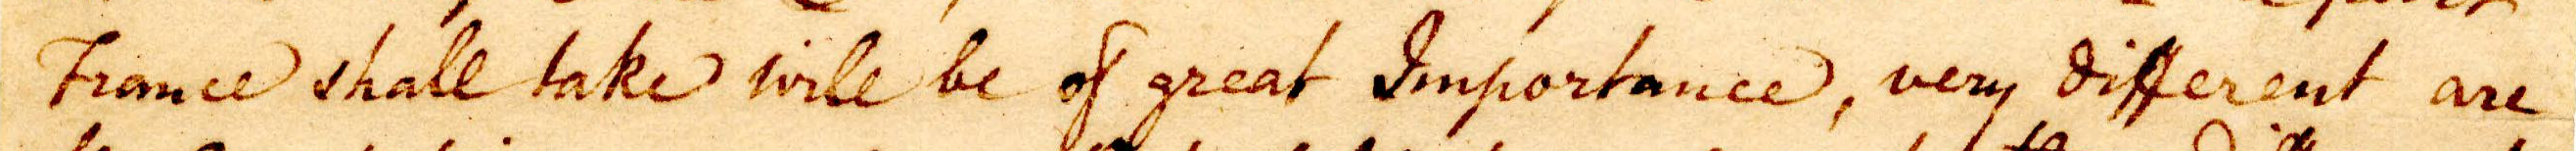France shall take will be of great Importance, very different are
